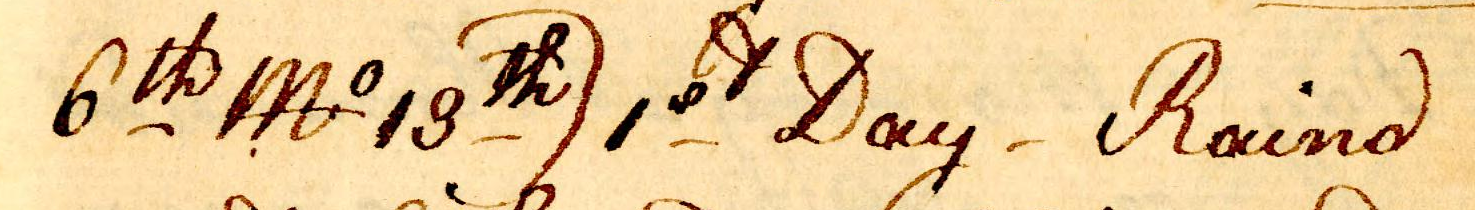6^th M^o 13^th) 1^st Day- Raind
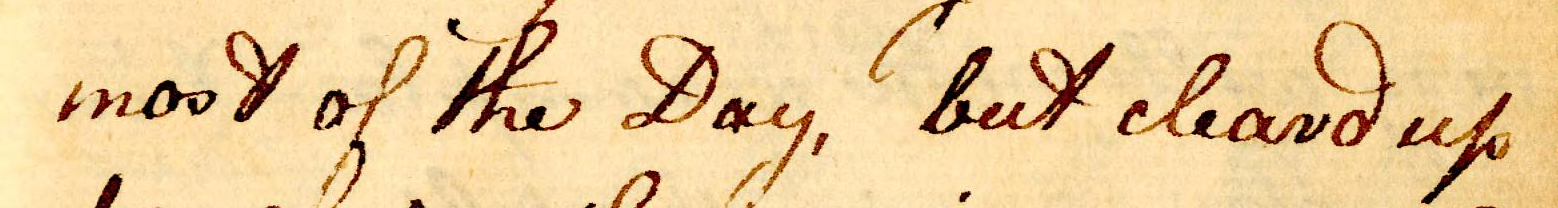most of the Day, but cleard up
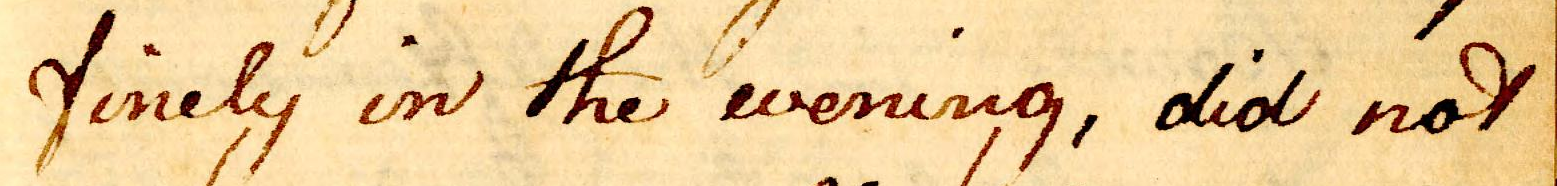finely in the evening, did not
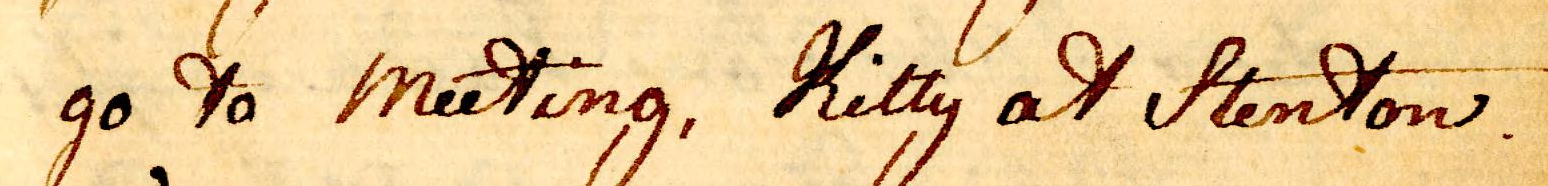go to Meeting, Kitty at Stenton
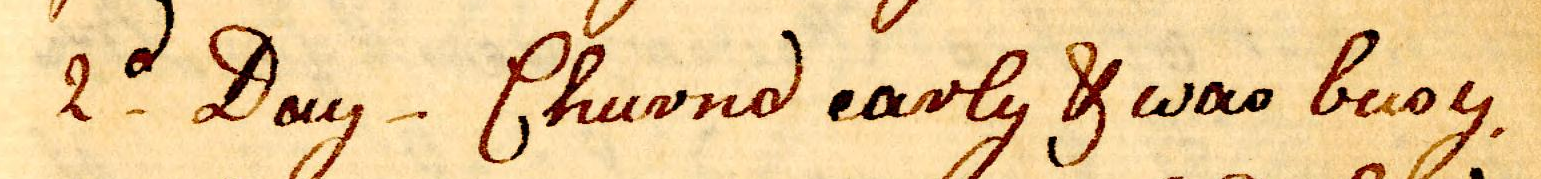2^d Day- Churned early & was busy,
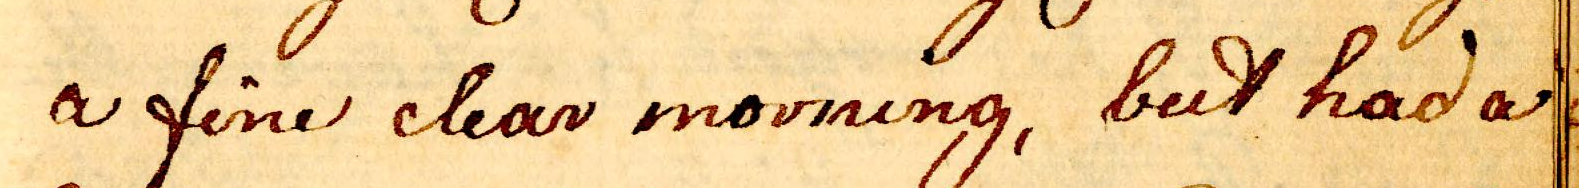a fine clear morning, but had a
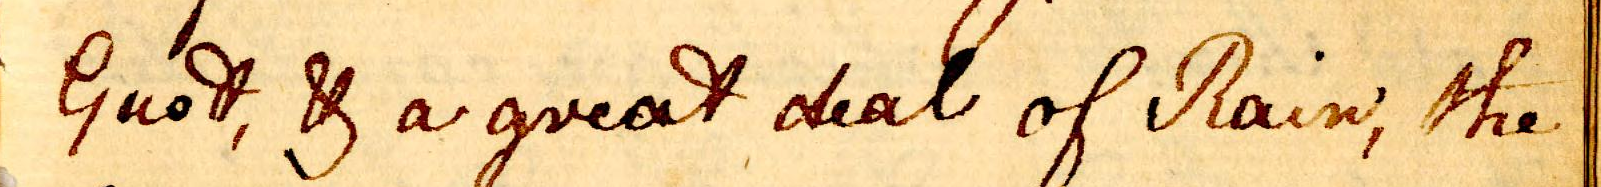Gust, & a great deal of Rain, the
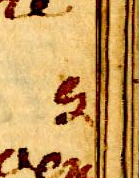g
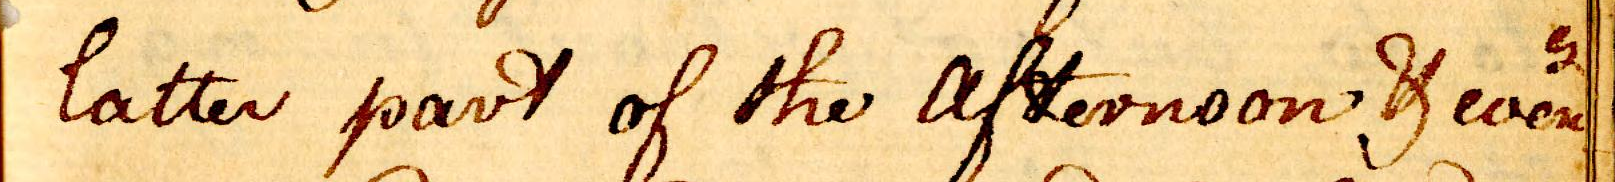latter part of the Afternoon & even
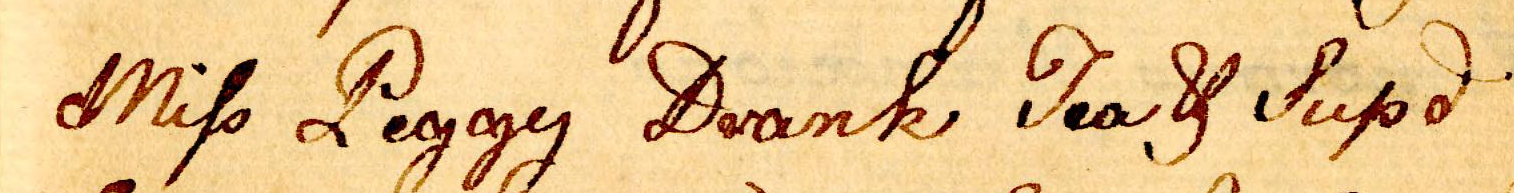Miss Peggy Drank Tea & Supd
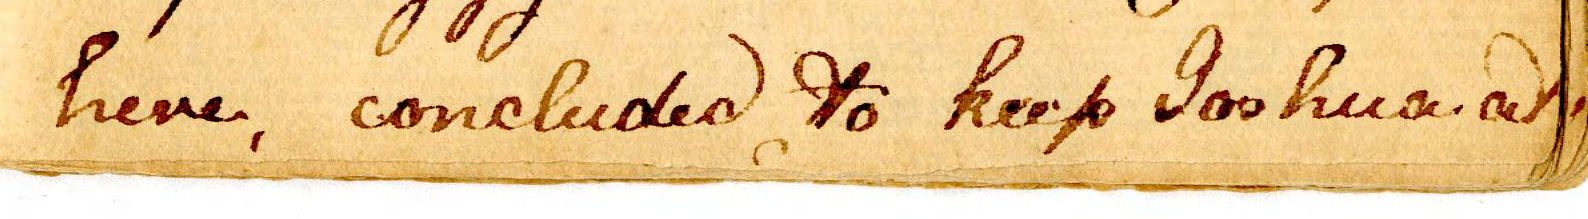here, concluded to keep Joshua at
